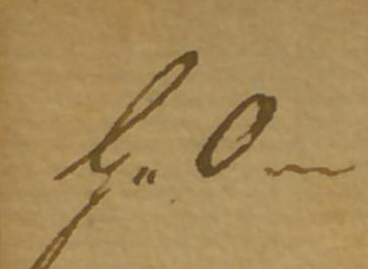G. O-
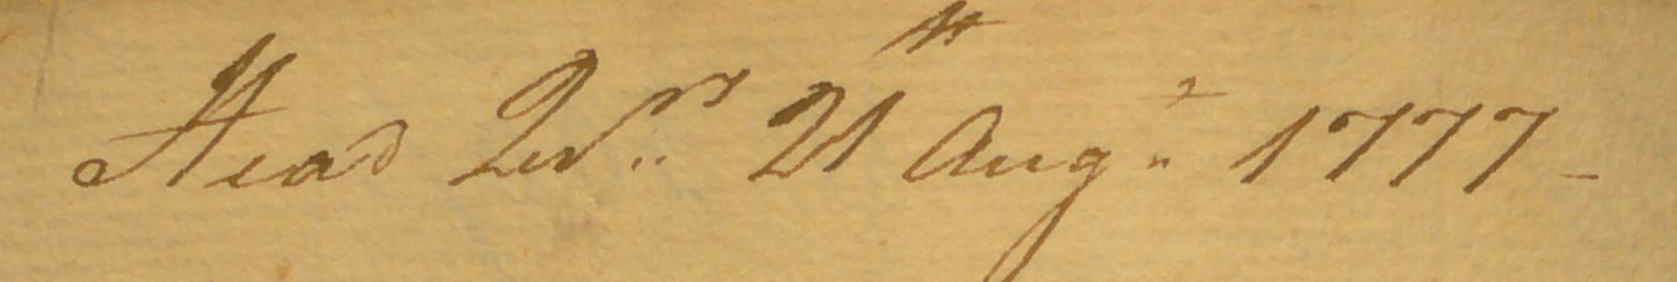Head Qu^rs. 21^st Aug^t. 1777-
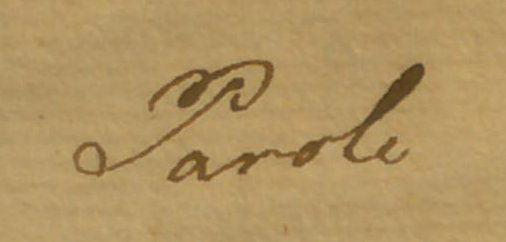Parole
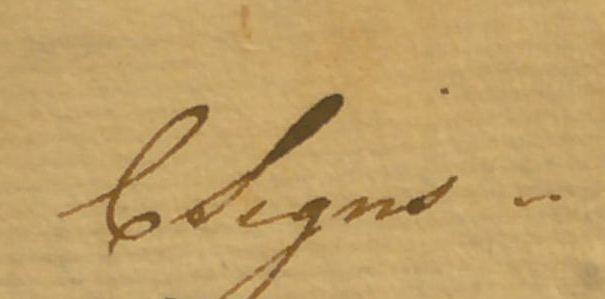C Signs.
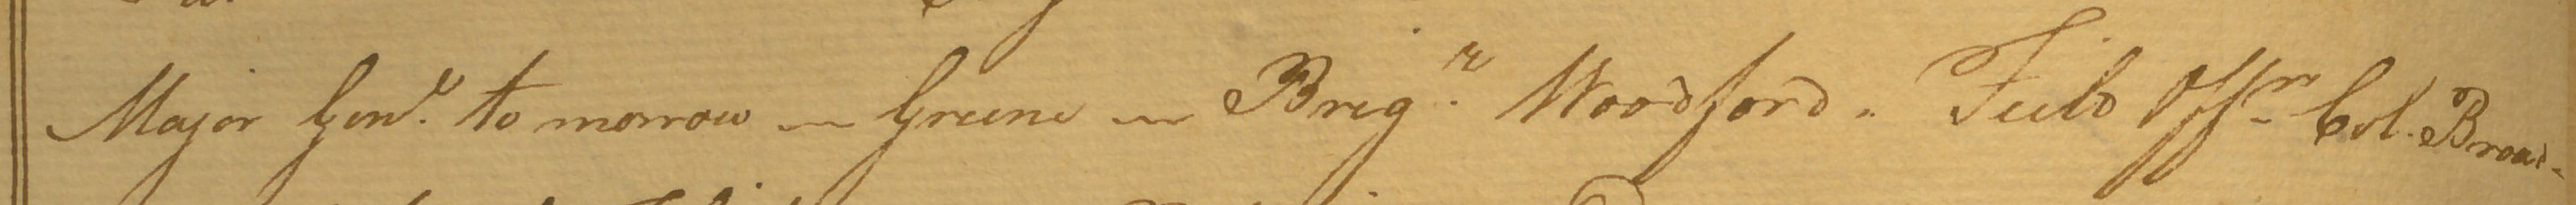Major Gen^l. tomorrow- Greene- Brig^r. Woodford. Field Off^rs. Col. Broad-
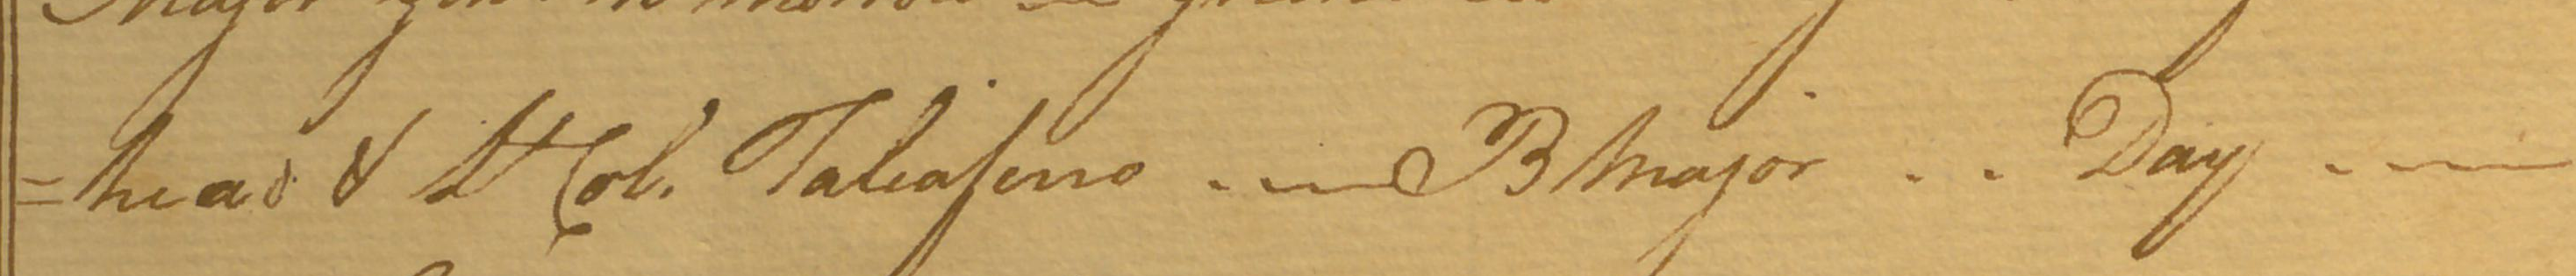-head & L^t Col. Taliaferro.- B Major .. Day .-
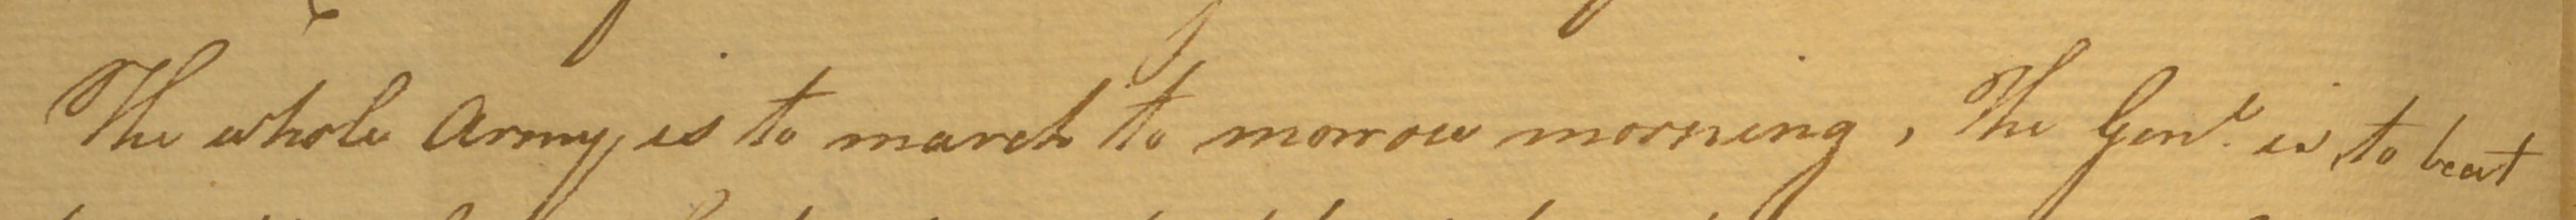The whole Army is to march to morrow morning, The Gen^l. is to be out
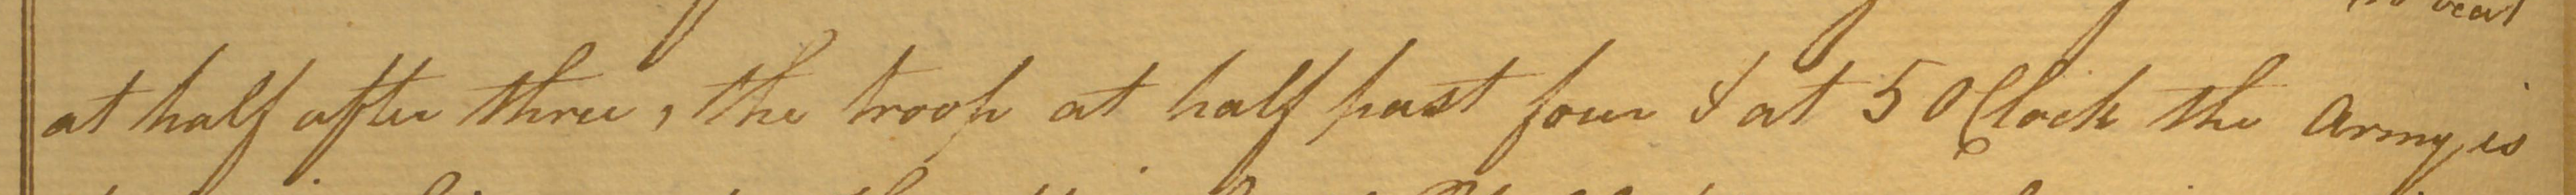at half after three, the troop at half past four & at 5 oClock the Army is
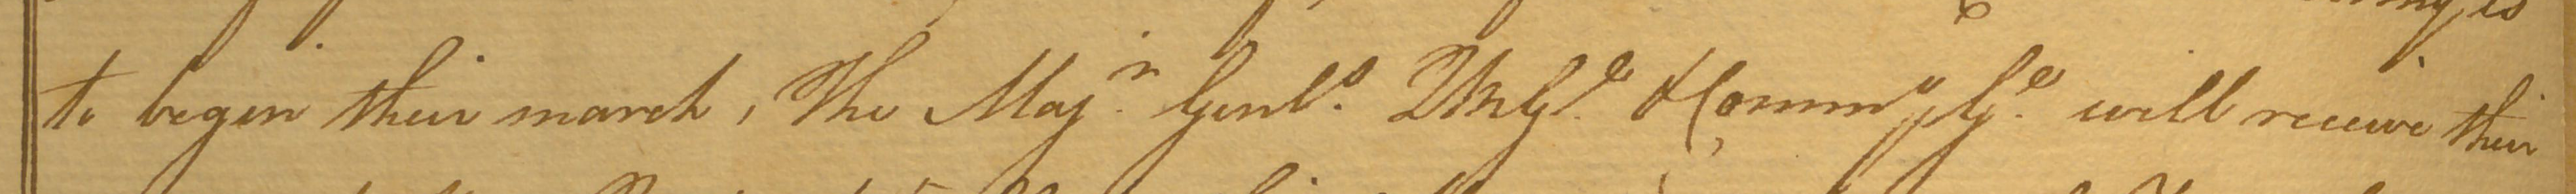to begin their march, The Maj^r. Gen^ls. QMG^l. & Comm^r G^l. will receive their
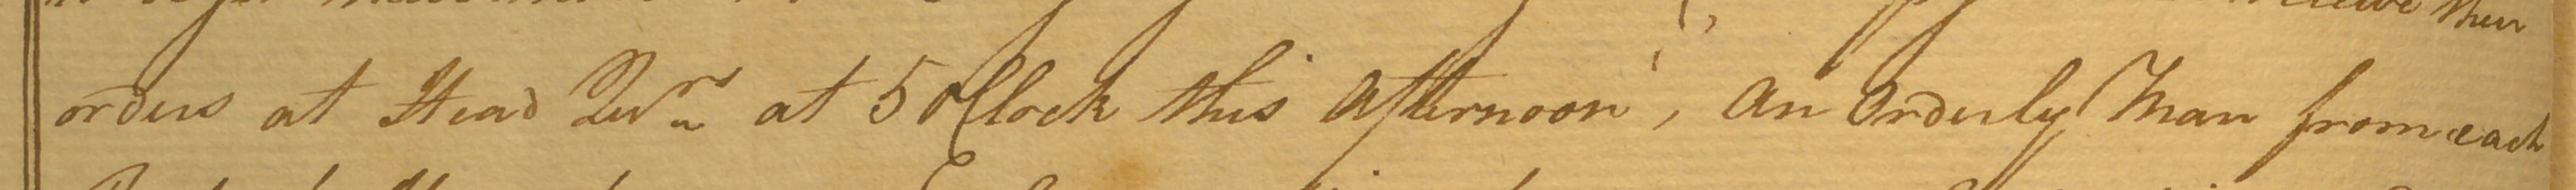orders at Head Qu^rs. at 5 oClock this afternoon, an orderly Man from each
